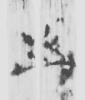之
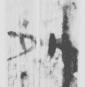外
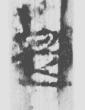是
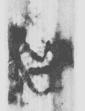向
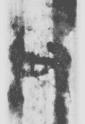又
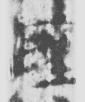聖
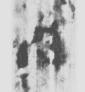人
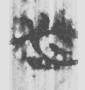必
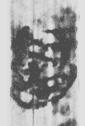智
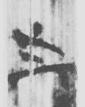之
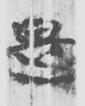是
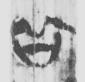向
